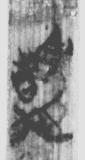{靜心}
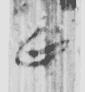㠯（以）
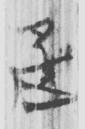{厃止}
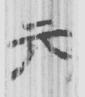亓
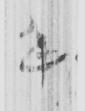身
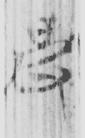皮
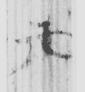亓
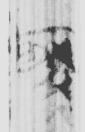所
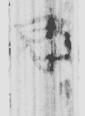君
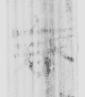者
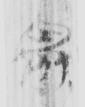眾
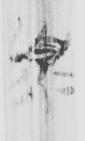寡
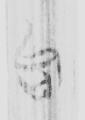句
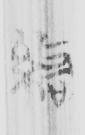紿
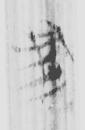𦘔
